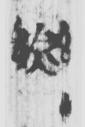樂
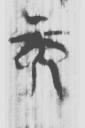而
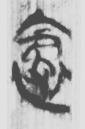{衣卞又}
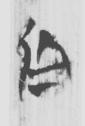於
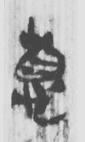惪
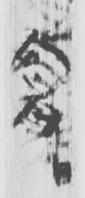宜
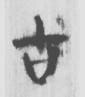古
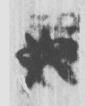四
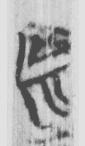巟
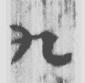九
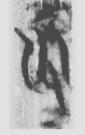州
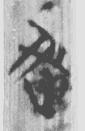各
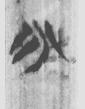分
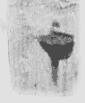十
